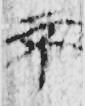不
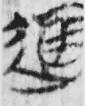𬨭（將）
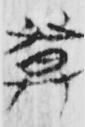登
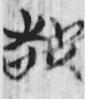○（告）
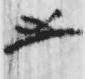之
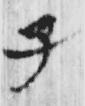子
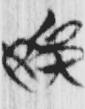娭
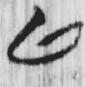㠯（以）
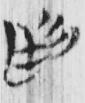○（廷）
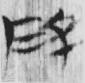阩
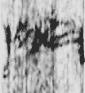門
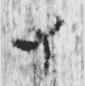又
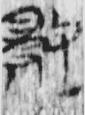敗
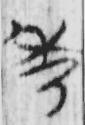秀
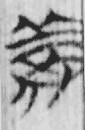義
